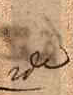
ide
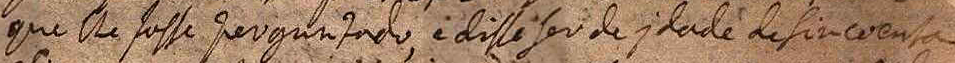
que lhe fosse perguntado, e disse ser de jdade de sincoenta
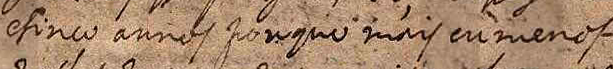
e sinco annos pouquo mais ou menos
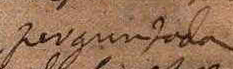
perguntada
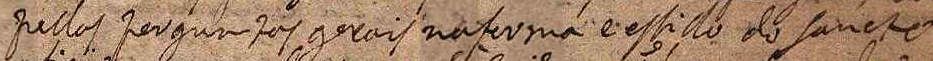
pellas perguntas gerais na forma e estillo do sancto
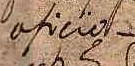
oficio
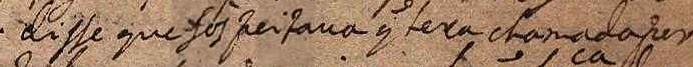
disse que sospeitaua q̄ sera chamada por
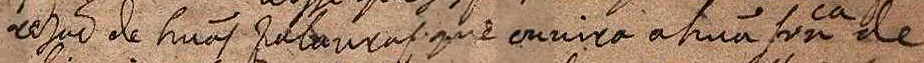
rezaõ de huās palauras que ouuira a huā frnca de
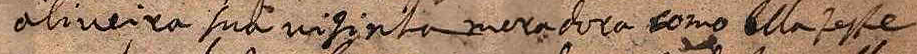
oliueira sua uizinha moradora como ella teste
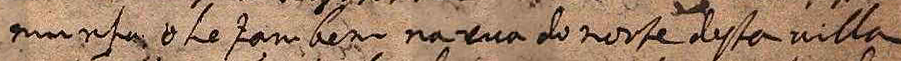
munha o he tambem na rua do norte desta uilla
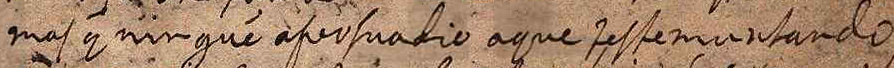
mas q̄ ninguē a persuadio a que testemunhando
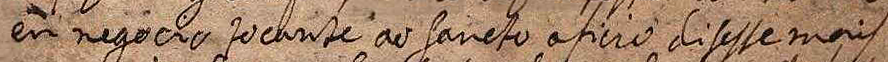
en negocio tocante ao sancto oficio disesse mais
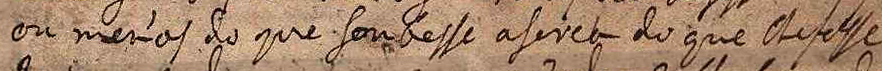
ou menos do que soubesse aserca do que lhe fosse
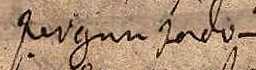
perguntado
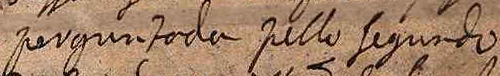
perguntada pello segundo
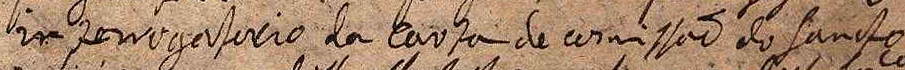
interrogatorio da carta de comissaõ do sancto
